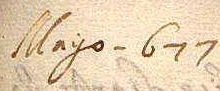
Mayo - 677
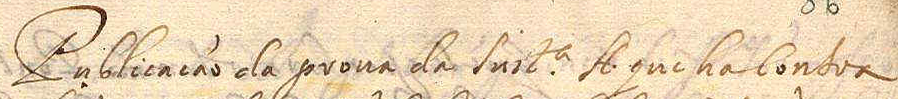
Publicaçaõ da proua da Iust.a A. que ha contra
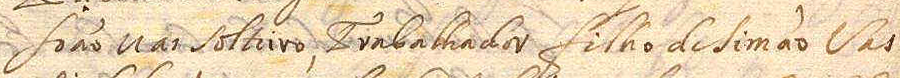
Joaõ uas solteiro, Trabalhador filho de Simaõ Vas
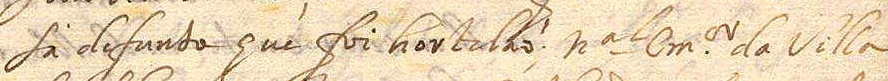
já defunto que foi hortelaõ; n.al e m.or da Villa
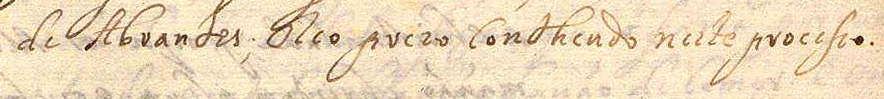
de Abrantes; Reo prezo contheudo neste processo.
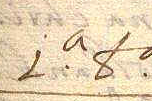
1.a t.a
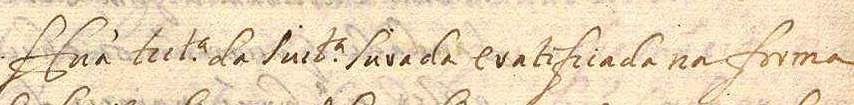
Huā test.a da Iust.a Iurada e ratificada na forma
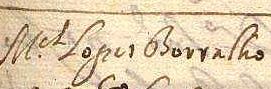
M.el Lopes Borralho
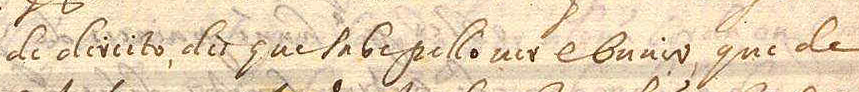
de direito, dis que sabe pello uer e ouuir, que de
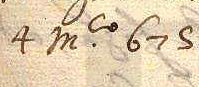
4 m.co 675
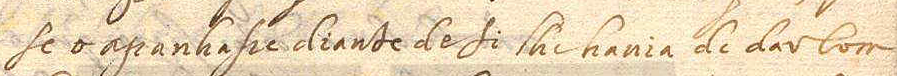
se o apanhasse diante de si lhe hauia de dar com
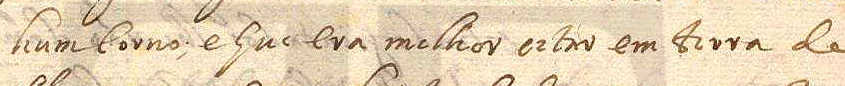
hum Corno; e Que era melhor estar em terra de
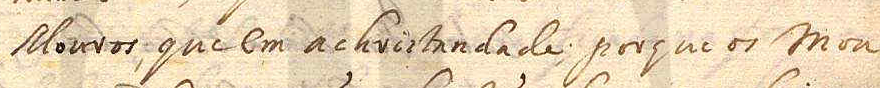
Mouros, que em a christandade; porque os mou
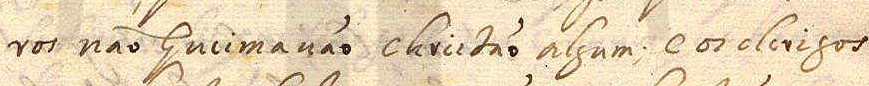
ros não queimauaõ christaõ algum; e os clerigos
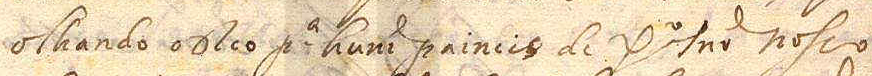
olhando o Reo p.a huns paineis de Xo snr̄ nosso
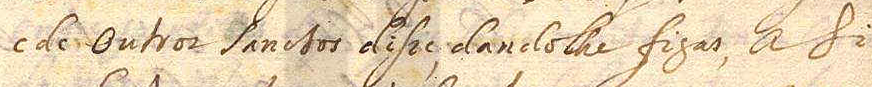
e de Outros Sanctos disse, dandolhe figas, a ti
